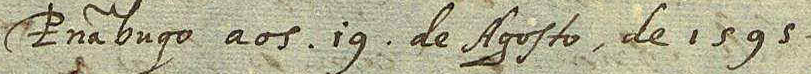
Ꝑnābuqo aos . i9 . de Agosto , de 1595
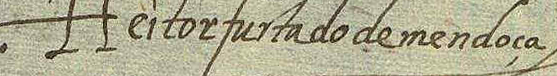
Heitor furtado de mendonça
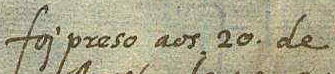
foi preso aos 20. de
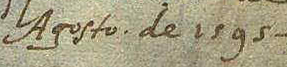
Agosto . de 1595 -
